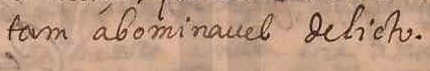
tam abominauel delicto.
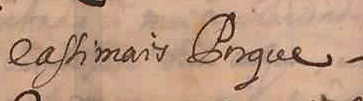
e assi mais Porque
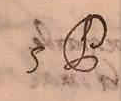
5 P
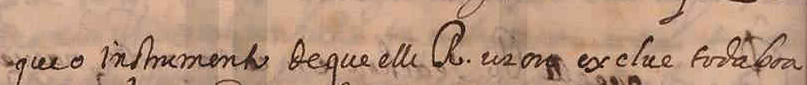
que o instrumento de que elle R. uzou exclue toda boa
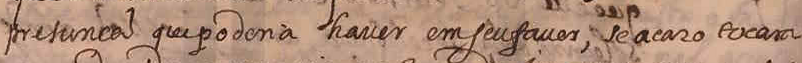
presunçaõ que poderia hauer em seu fauor, se acazo tocara
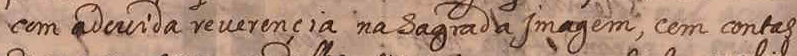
com a deuida reuerencia na Sagrada Jmagem, com contas
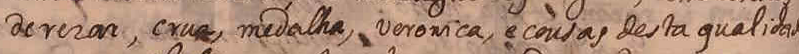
de rezar, crux, medalha, veronica, e cousas desta qualidad
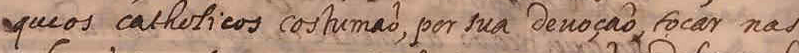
que os catholicos costumaõ, por sua deuoçaõ, tocar nas
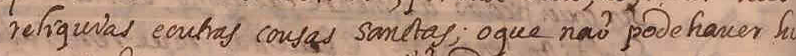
reliquias e outras cousas sanctas; o que naõ pode hauer lu
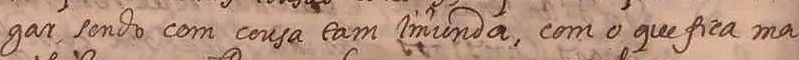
gar, sendo com cousa tam Imunda, com o que fica ma
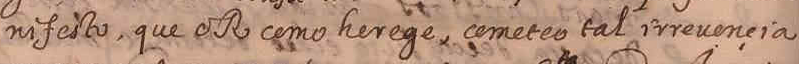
nifesto, que o R como herege, cometeo tal irreuençia
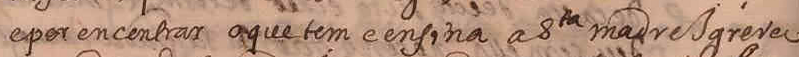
e por encontrar o que tem e ensina a Sta madre Igreia
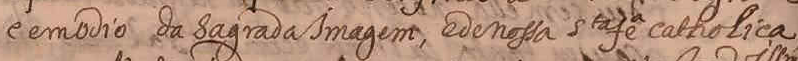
e em odio da Sagrada Imagem, e de nossa sta fê catholica
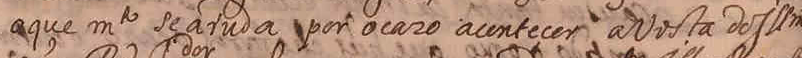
a que mto se aiuda por o cazo acontecer a Vista do Jllmo
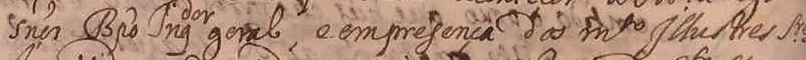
snōr Bpō Inqdor geral, e em presença dos mto Jllustres s.re
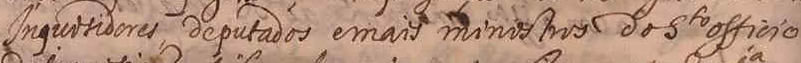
Inquisidores, deputados e mais ministros do Sto officio
